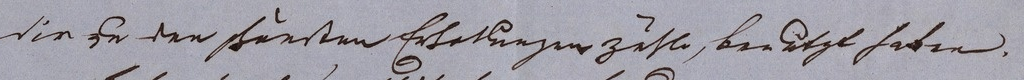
dir zu den schönsten Erholungen zähle, benutzt haben.
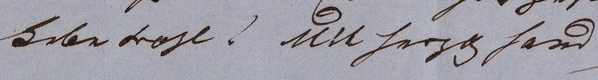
Lebe wohl! Mit Herz & Hand
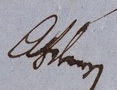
Bern
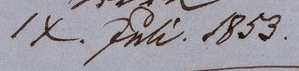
14. Juli. 1853.
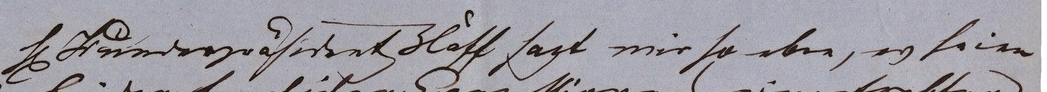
Herr Bundespräsident Näff sagt mir so eben, es seien
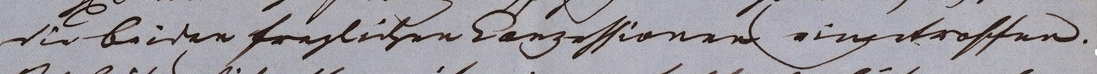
die beiden fraglichen Conzessionen eingetroffen.
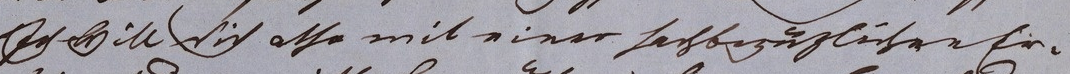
Ich will dich also mit einer sachbezüglichen Er-
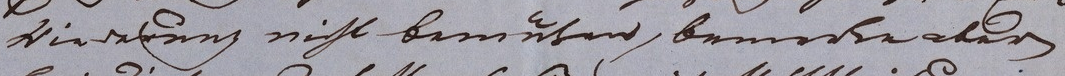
wiederung nicht bemühen, bemerke aber
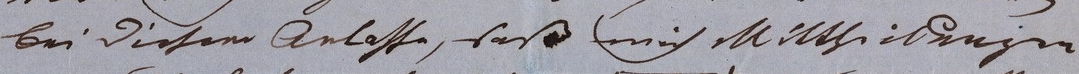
bei diesem Anlasse, daß mich Mittheilungen
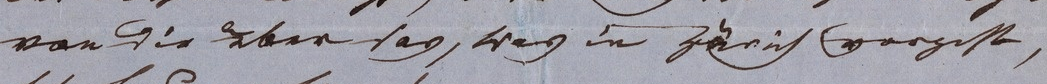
von Dir über das, was in Zürich vorgeht,
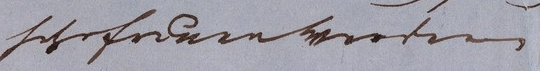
sehr freuen werden.
